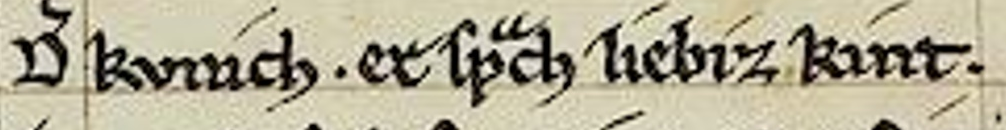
D(er) kvnich. er ſp(ra)ch liebiz kint.
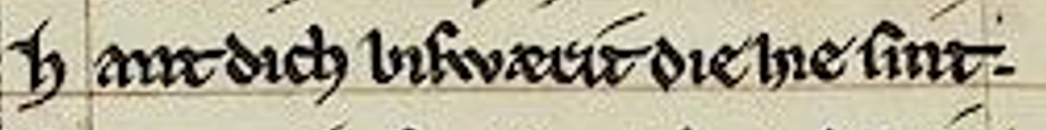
Hant dich biſw[ae]rit die hie ſint.
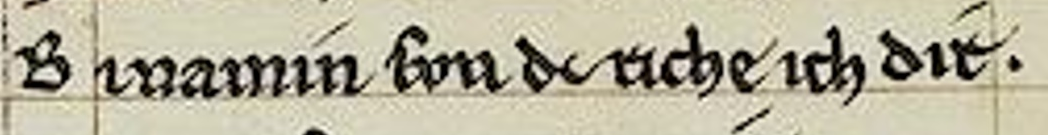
Binamin ſvn d(az) riche ich dir.
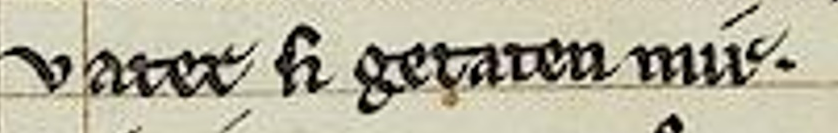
Vater ſi getaten mir.
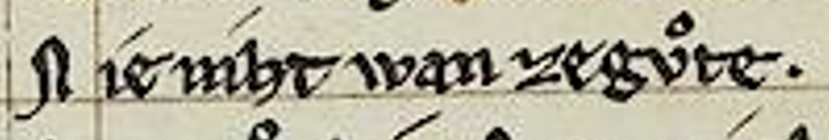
Nie niht wan ze gv°ote.
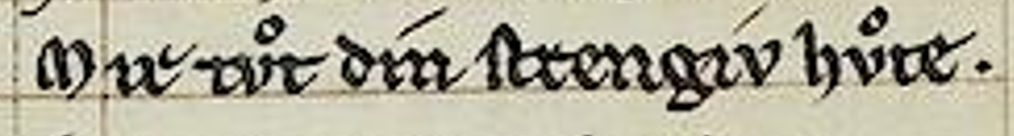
Mir tv°ot din ſtrengiv hv°ote.
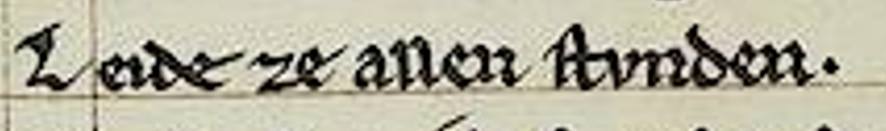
Leide ze allen ſtvnden.
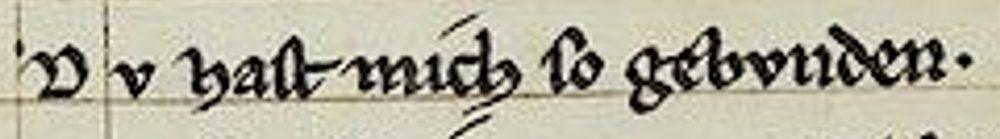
Dv haſt mich ſo gebvnden.
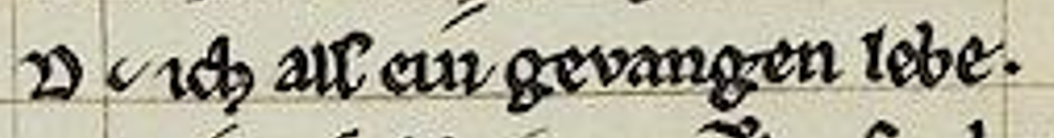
D(az) ich alſ ein gevangen lebe.
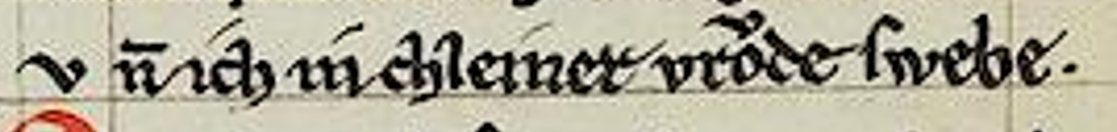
Vn(d) ich in chleiner vro°vde ſwebe.
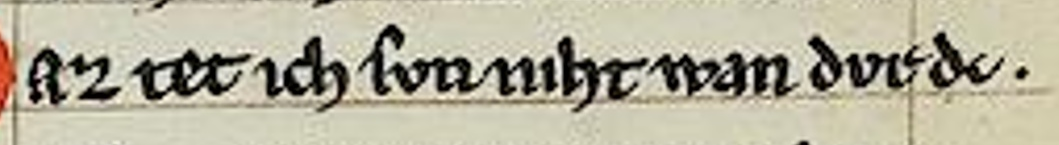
*Daz tet ich ſvn niht wan dvr d(az).
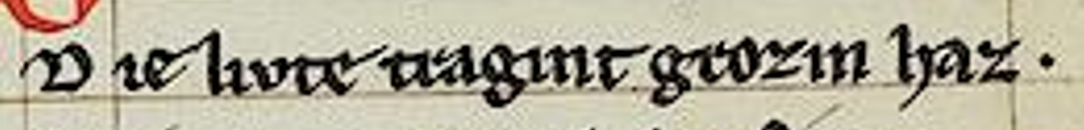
Die livte tragint grozin haz.
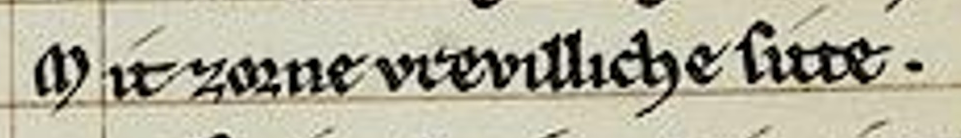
Mit zorne vrevilliche ſitte.
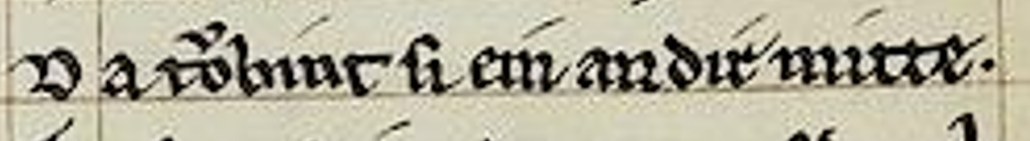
Da to°vbint ſi ein an dir mitte.
